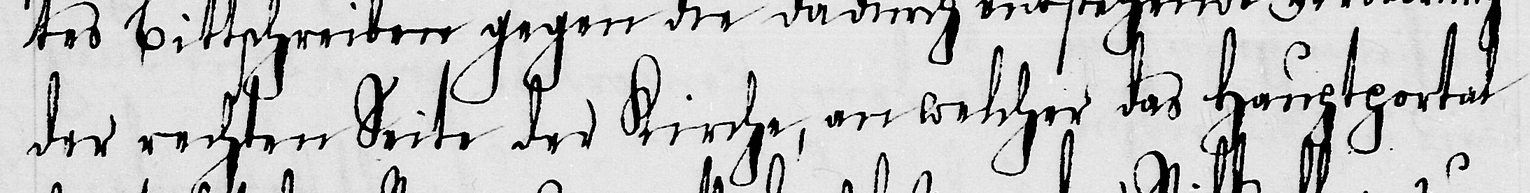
der rechten Seite der Kirche, an welcher das Hauptportal
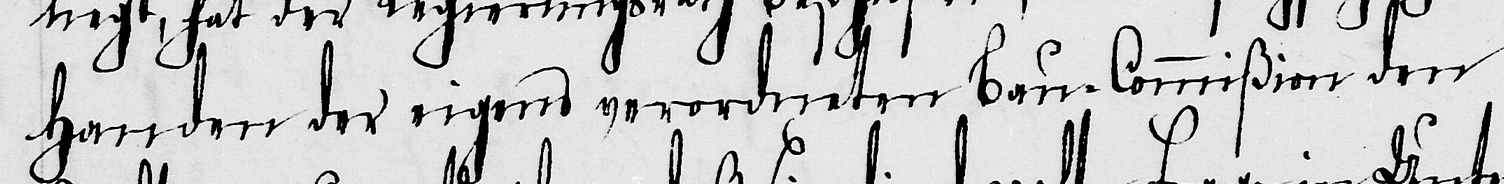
Handen der eigens verordneten Bau-Commißion den
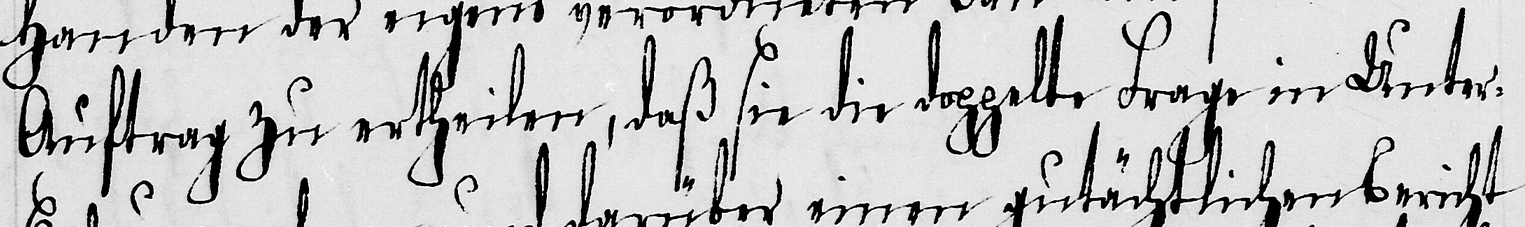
Auftrag zu ertheilen, daß sie die doppelte Frage in Unter¬
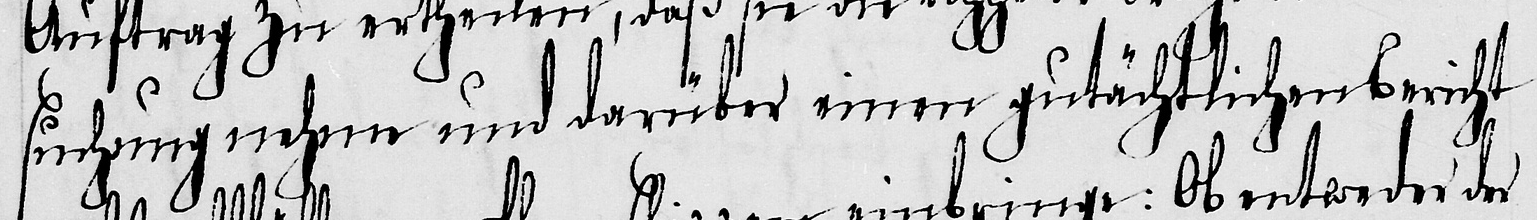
suchung nehme und darüber einen gutächtlichen Bericht
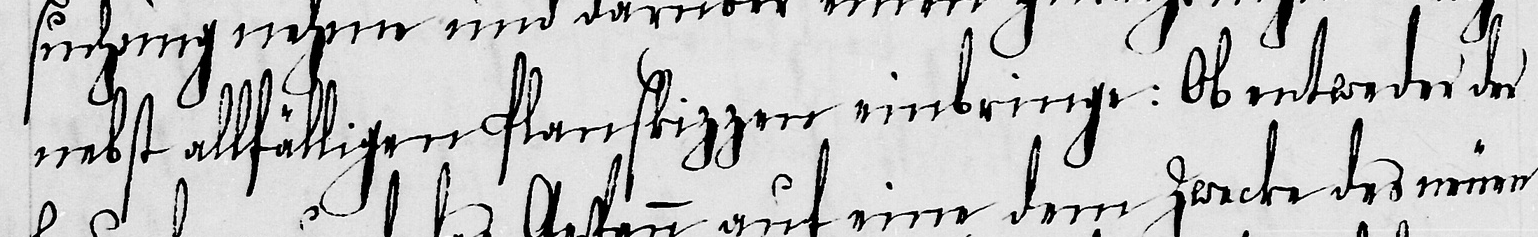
nebst allfälligen Planskizzen einbringe: Ob entweder der
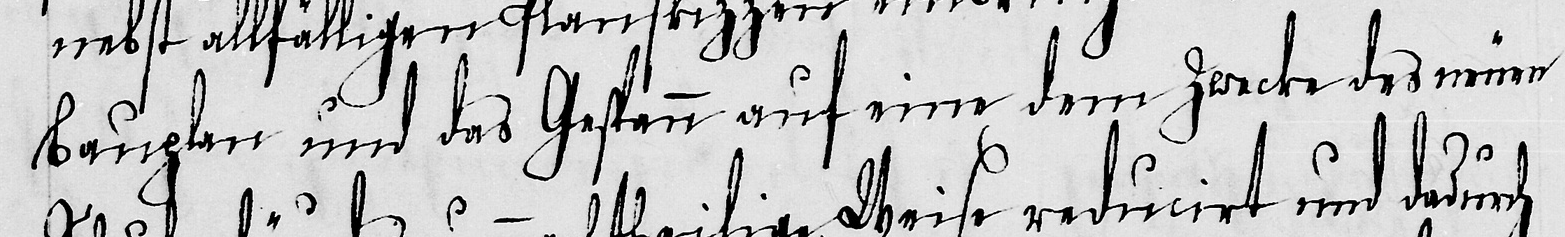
Bauplan und das Gespann auf eine dem Zwecke des neuen
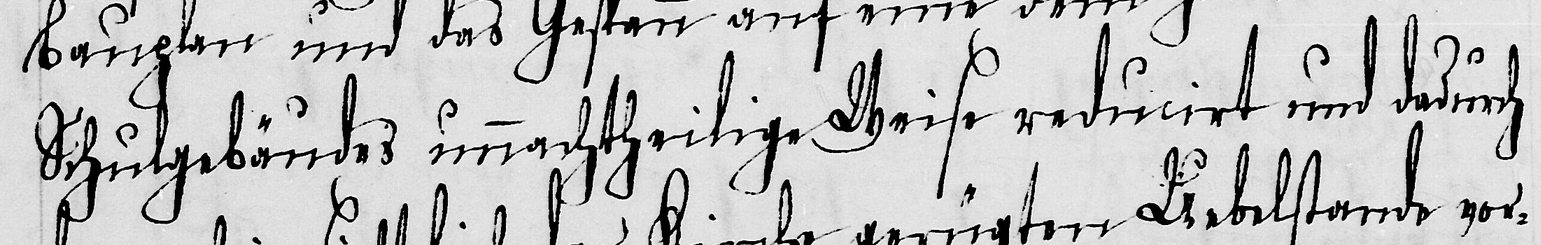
Schulgebäudes unnachtheilige Weise reducirt und dadurch
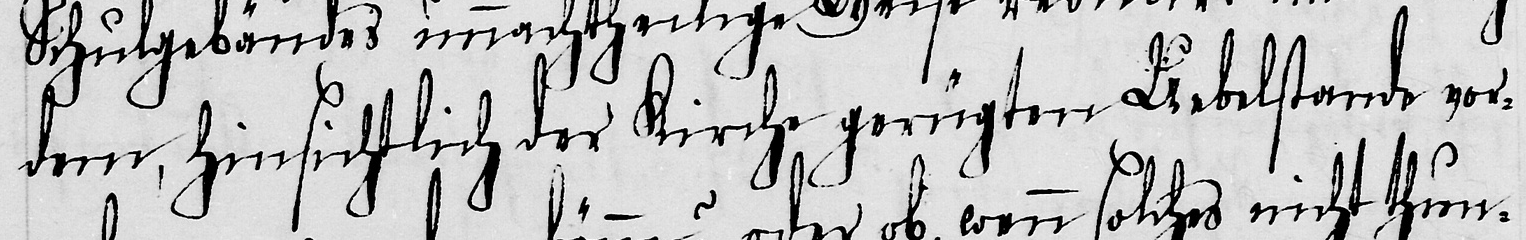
dem, hinsichtlich der Kirche gerügten Uebelstande vo¬
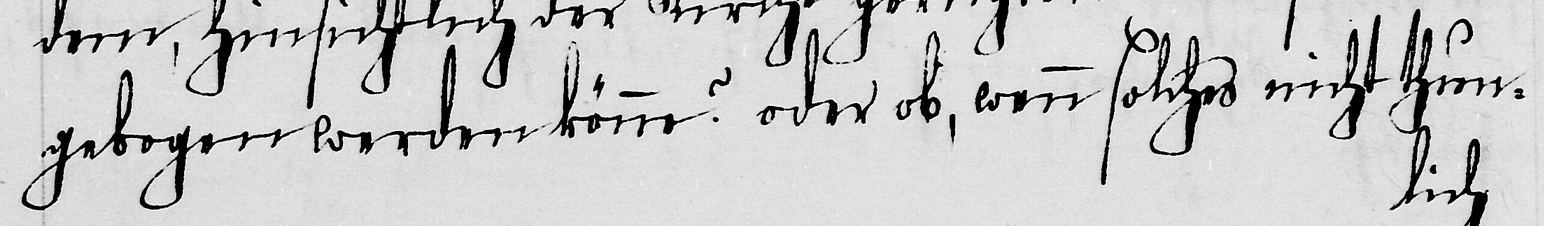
rgebogen werden könne? oder ob, wenn solches nicht thun-
